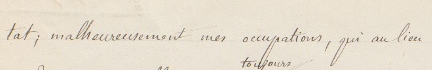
tat; malheureusement mes occupations, qui au lieu
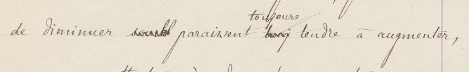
de diminuer sembl paraissent ...toujours tendre à augmenter,
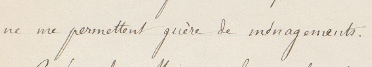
ne me permettent guère de ménagements.
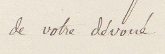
de votre dévoué
